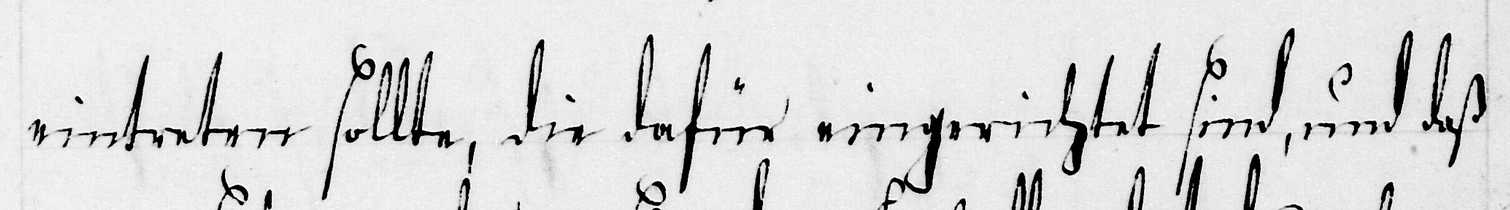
eintreten sollte, die dafür eingerichtet sind, und daß
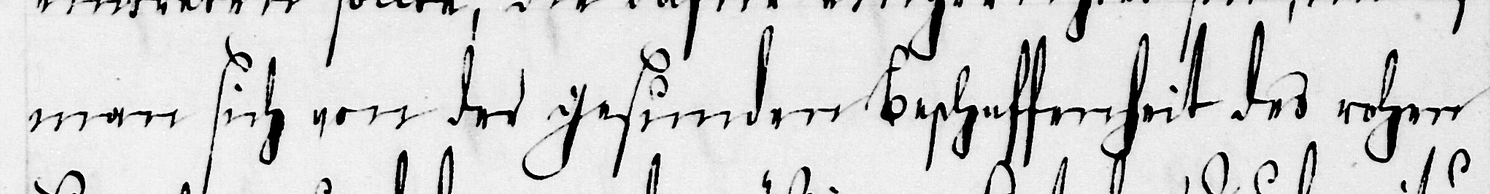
man sich von der gefunden Beschaffenheit des rohen
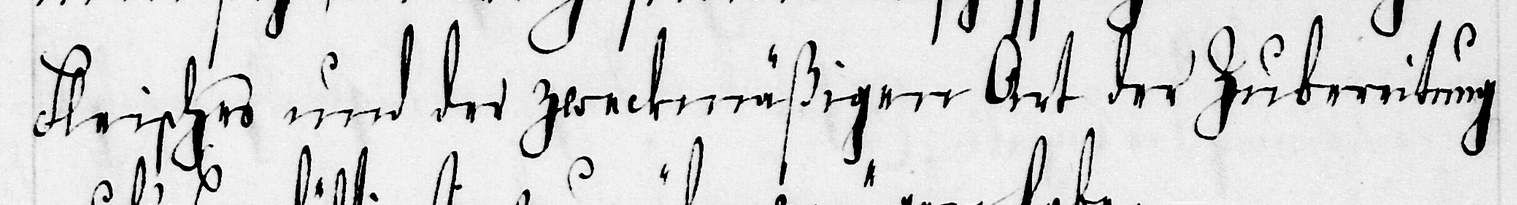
Fleisches und der zweckmäßigen Art der Zubereitung
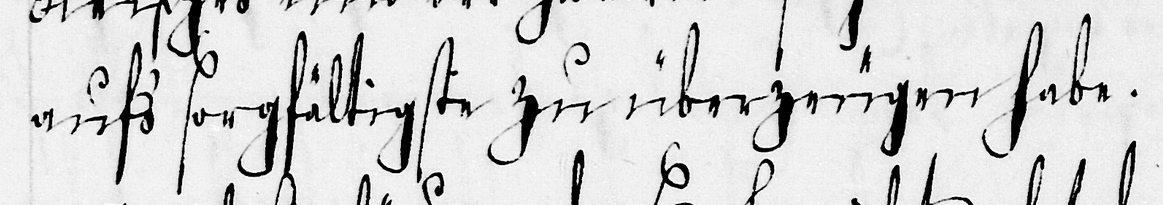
auf‘s sorgfältigste zu überzeugen habe.
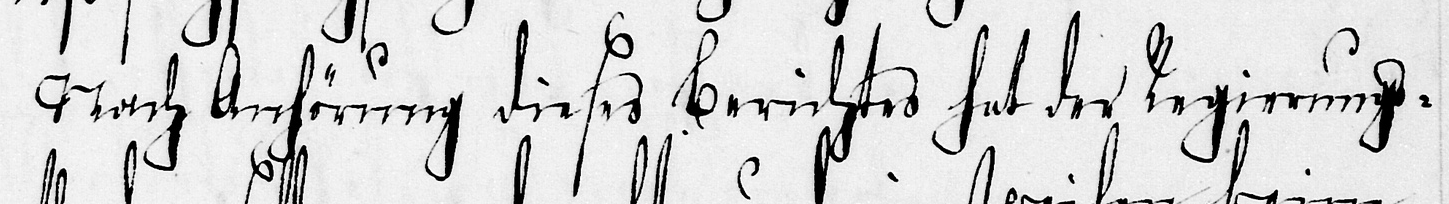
Nach Anhörung dieses Berichtes hat der Regierungs¬
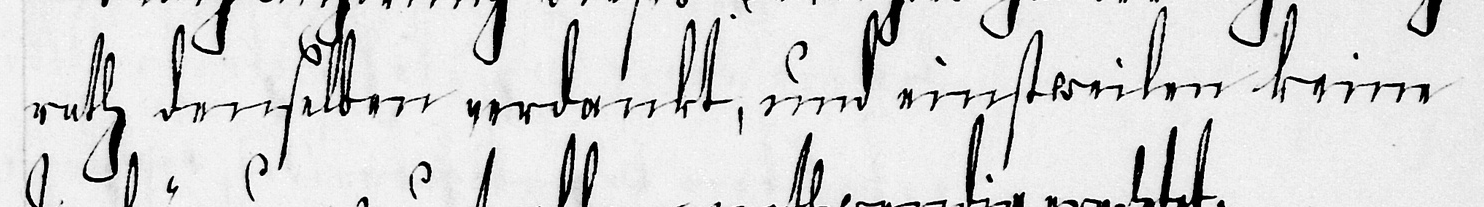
rath denselben verdankt, und einstweilen keine
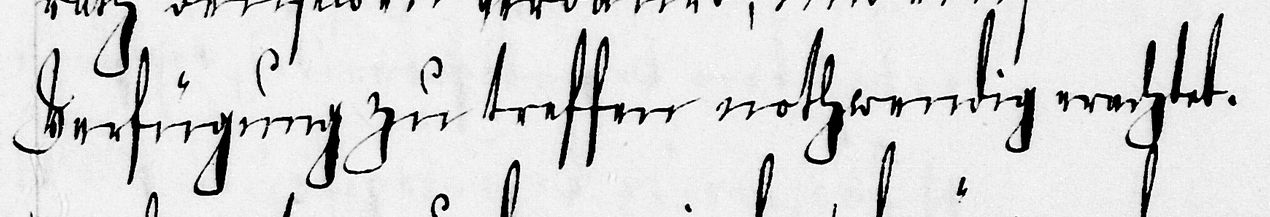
Verfügung zu treffen nothwendig erachtet.
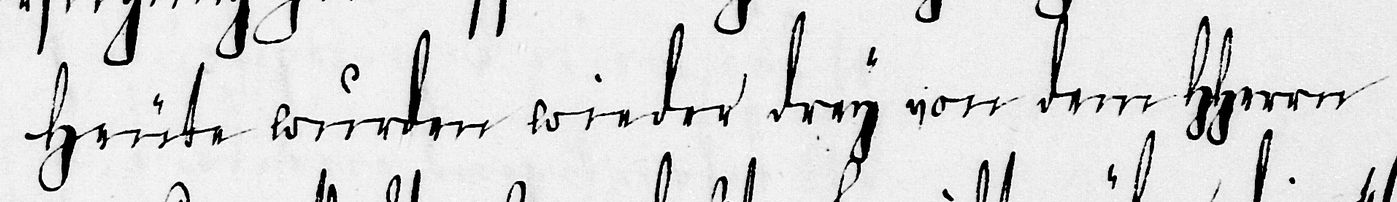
Heute wurden wieder drey von dem HHerrn
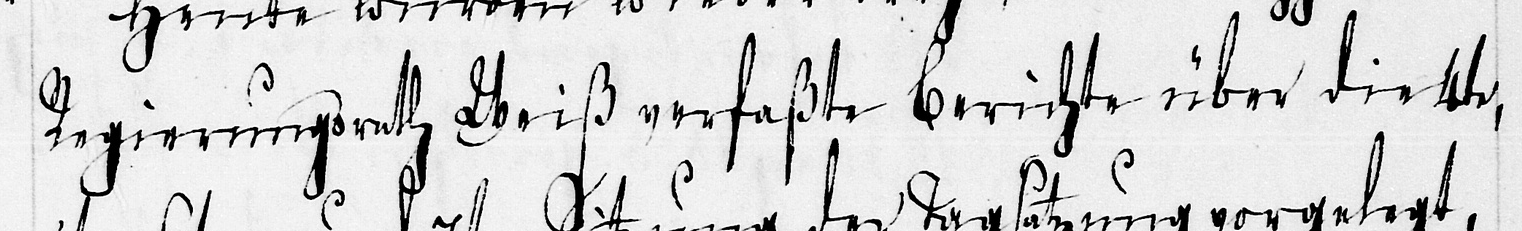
Regierungsrath Weiß verfaßte Berichte über die 4te,
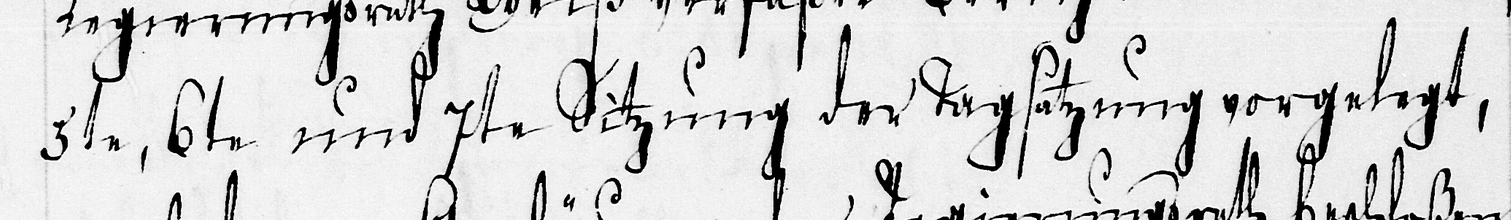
5te, 6te und 7te Sitzung der Tagsatzung vorgelegt,
